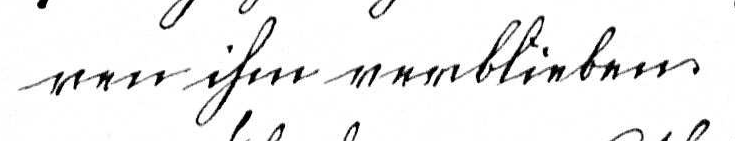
ren ihm verblieben.
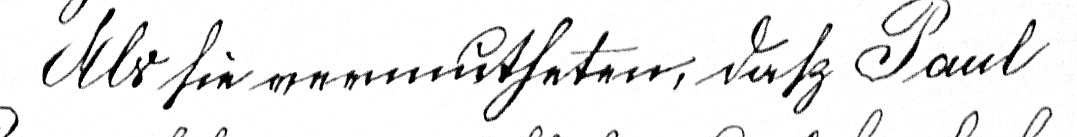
Als sie vermutheten, daß Paul
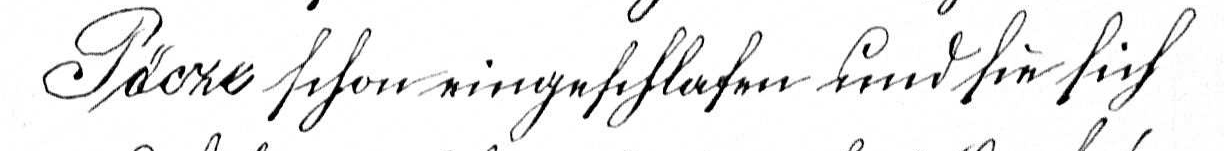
Pöcze schon eingeschlafen und sie sich
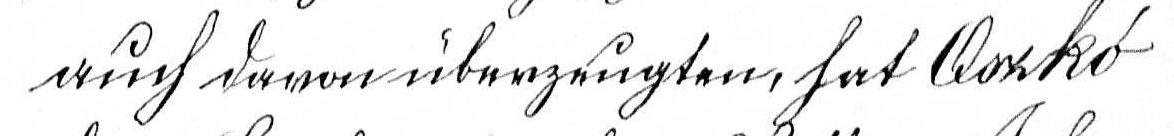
auch davon überzeugten, hat Oszkó
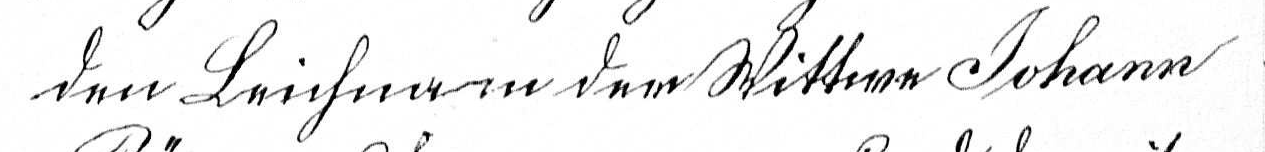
den Leichnam der Wittwe Johann
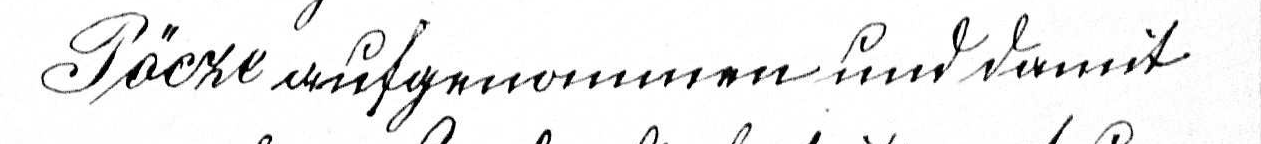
Pöcze aufgenommen und damit
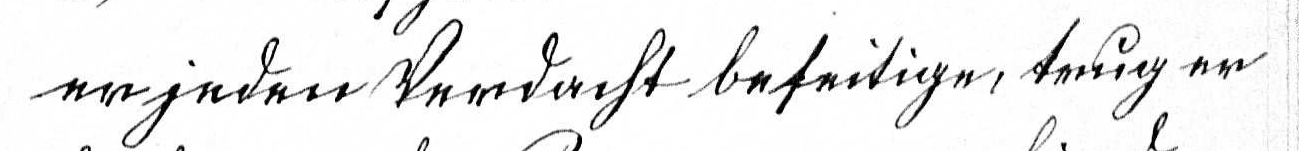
er jeden Verdacht beseitige, trug er
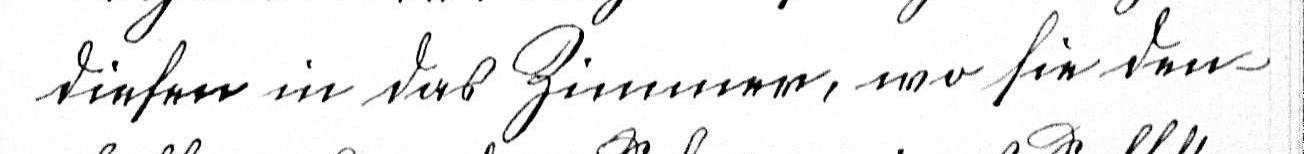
diesen in das Zimmer, wo sie den¬
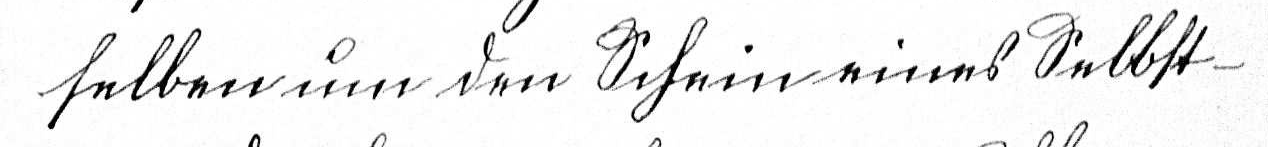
selben um den Schein eines Selbst¬
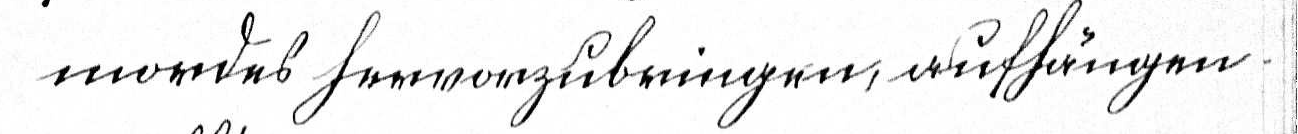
mordes hervorzubringen, aufhängen
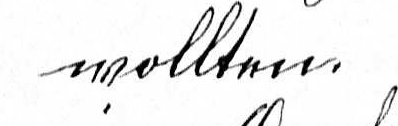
wollten.
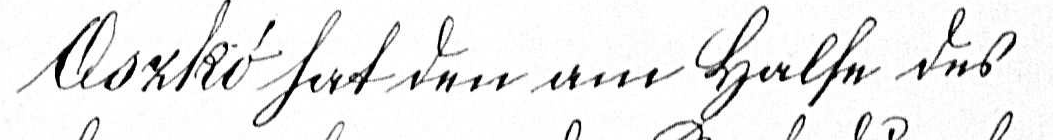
Oszkó hat den am Halse des
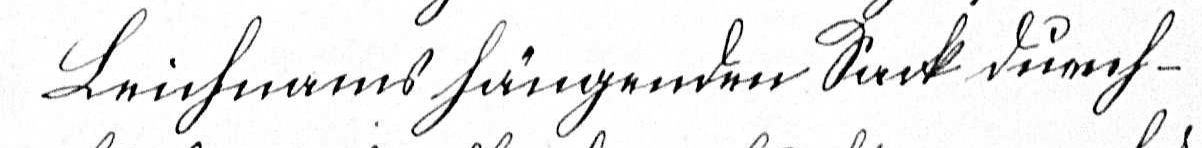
Leichnams hängenden Sack durch¬
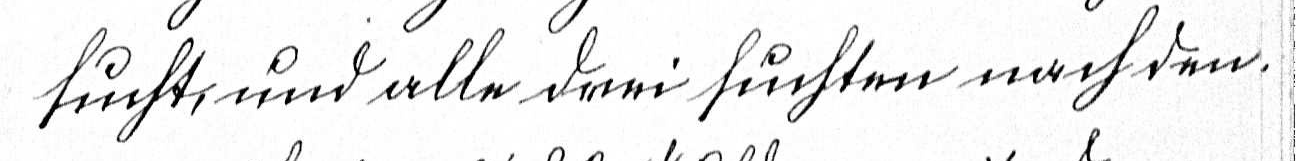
sucht und alle drei suchten nach den
